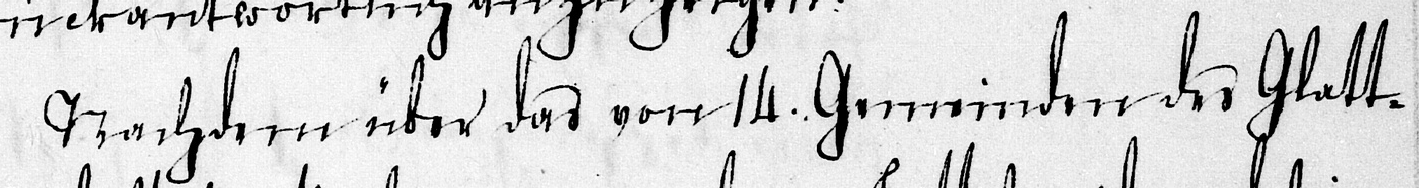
Nachdem über das von 14. Gemeinden des Glatt-
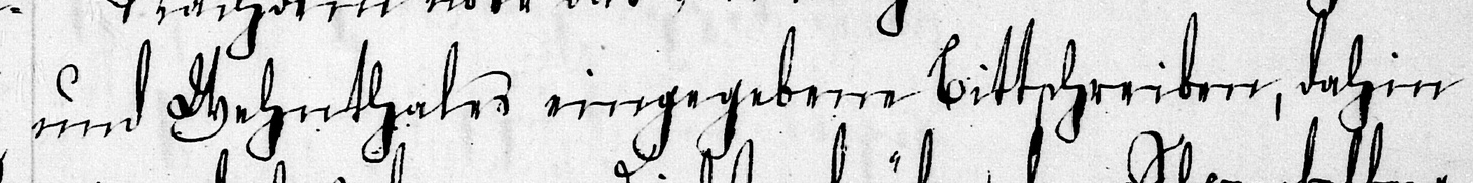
und Wehnthales eingegebene Bittschreiben, dahin
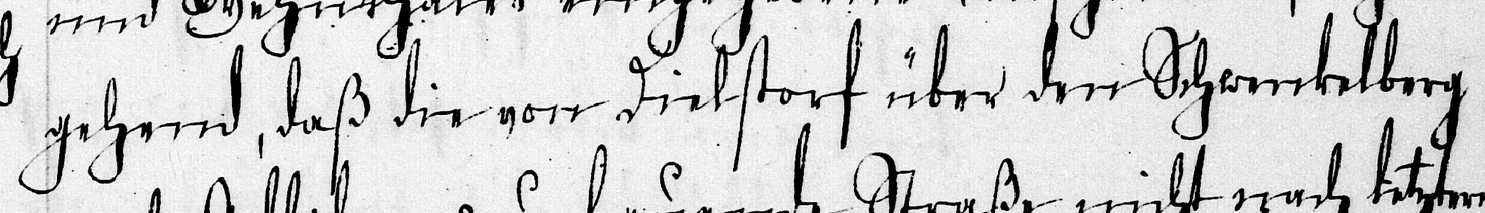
gehend, daß die von Dielstorf über den Schwenkelberg
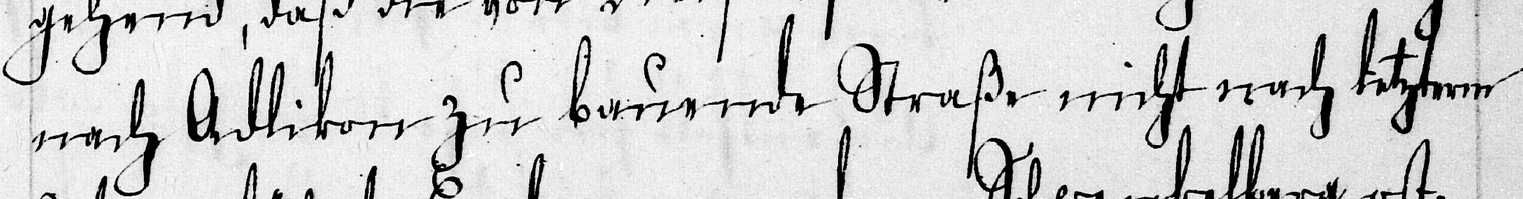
nach Adlikon zu bauende Straße nicht nach letzterm
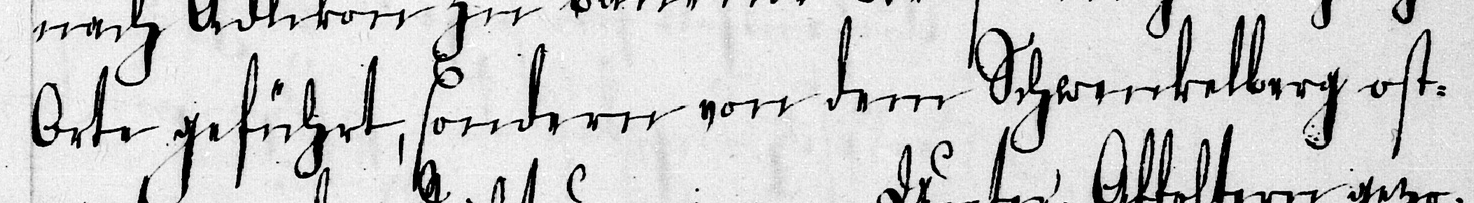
Orte geführt, sondern von dem Schwenkelberg ost¬
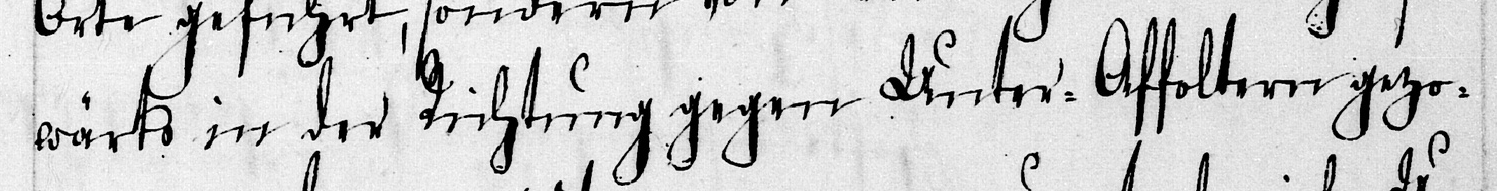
wärts in der Richtung gegen Unter-Affoltern gezo¬
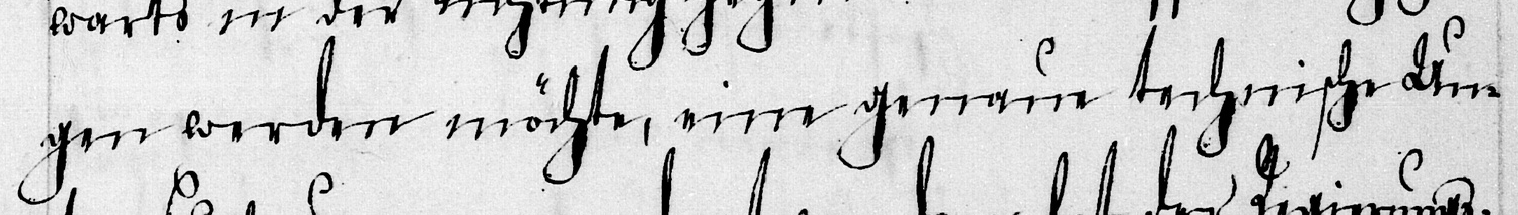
gen werden möchte, eine genaue technische Un¬
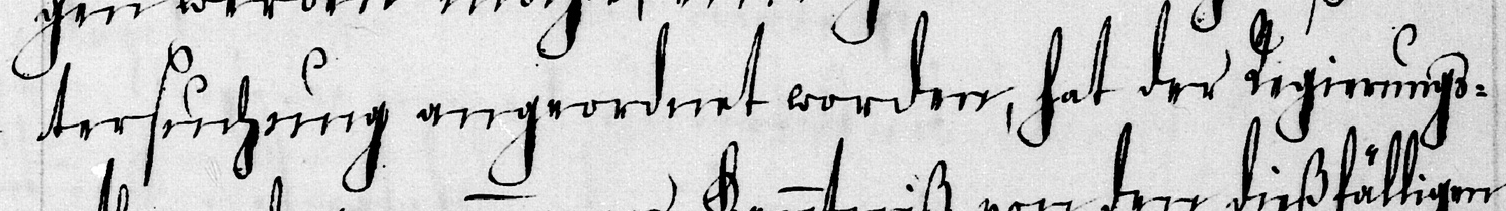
tersuchung angeordnet worden, hat der Regierungs¬
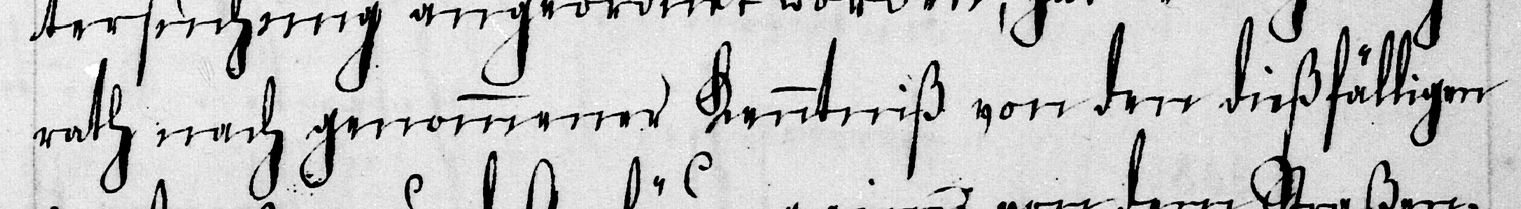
rath nach genommener Kenntniß von den dießfälligen
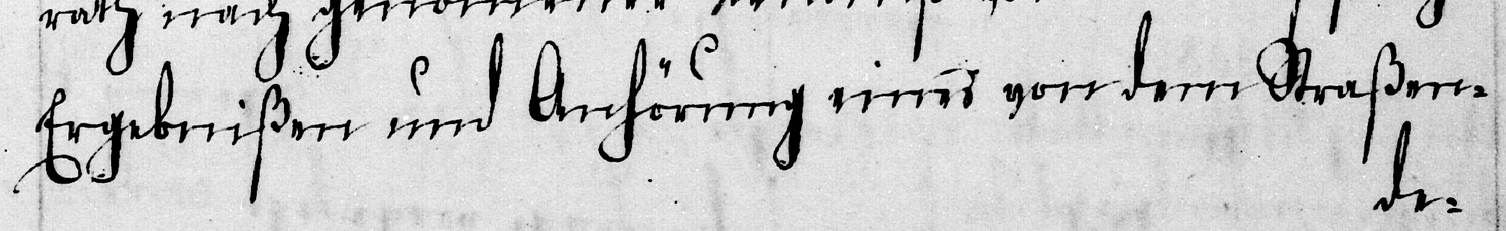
Ergebnißen und Anhörung eines von dem Straßen-
